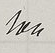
Minister
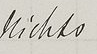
nichts
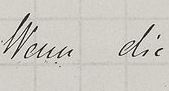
Neues. Die
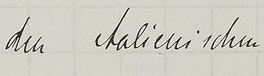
den italienischen
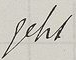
geht
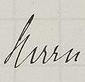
Koller
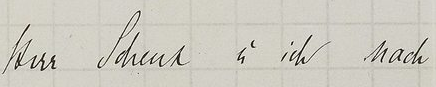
Herr Schenk u ich nach
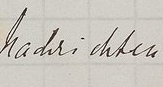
Göschenen. Ob sie
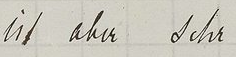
ist aber sehr
